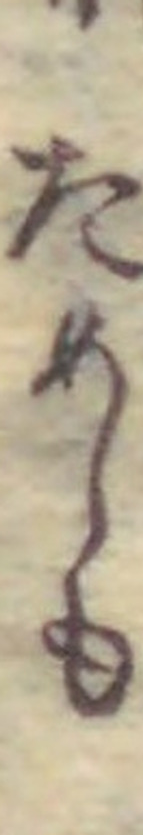ためしも
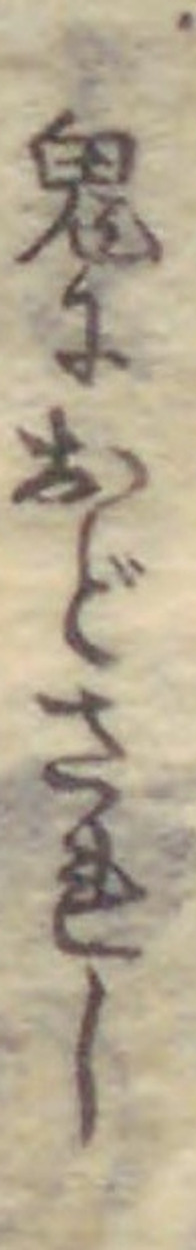鬼におどされし
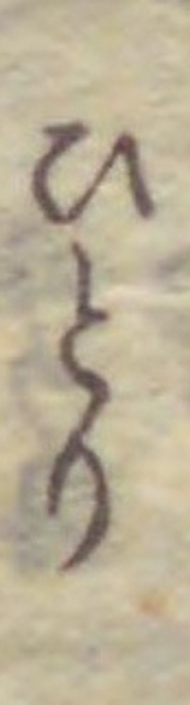ひとり
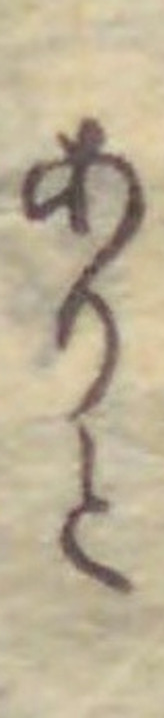ありと
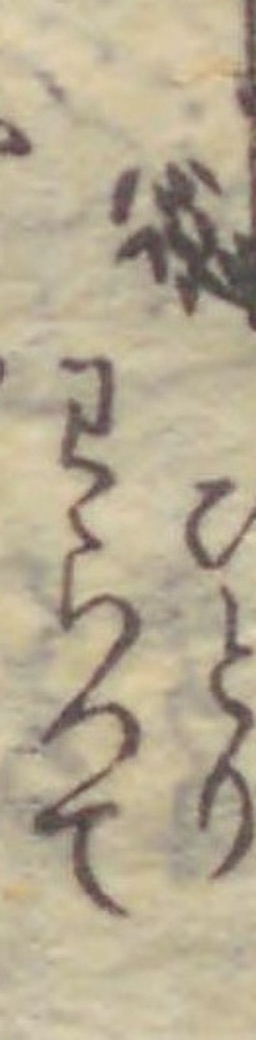わらつて
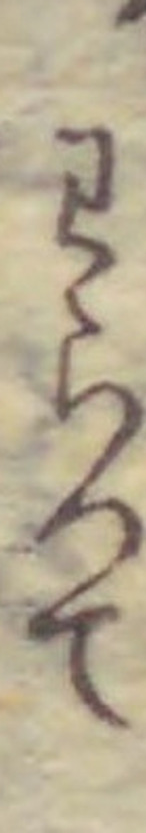わらつて
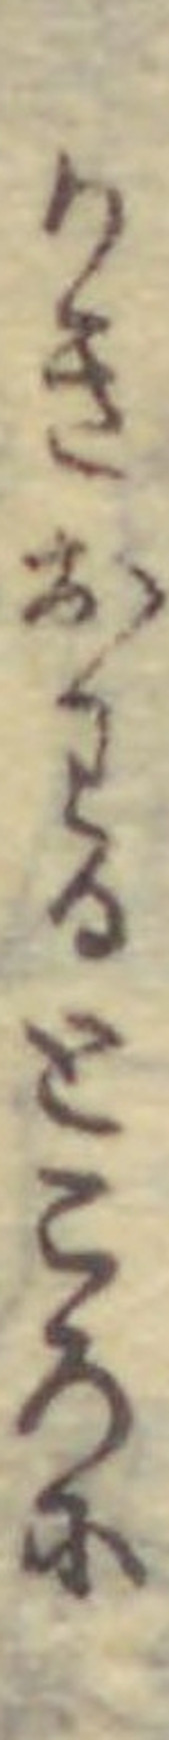かきおわるところに
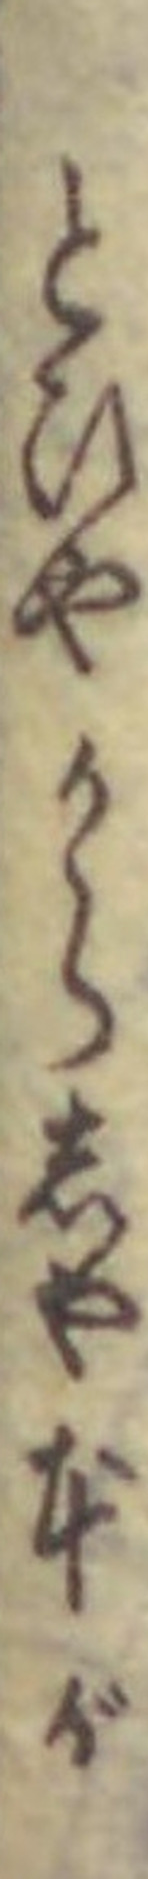とひやからしや本が
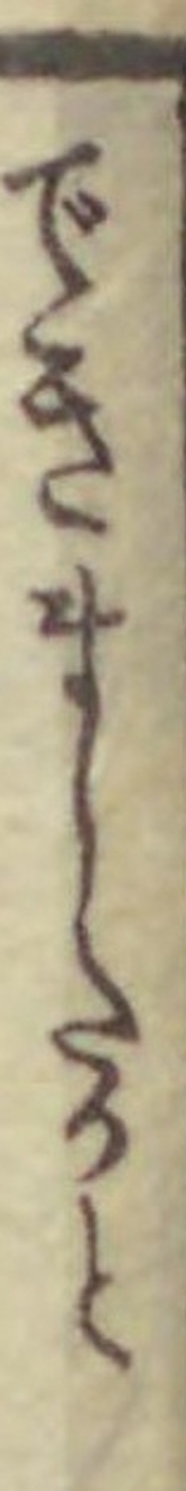できましたかと
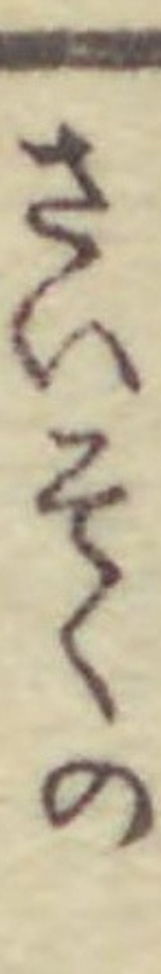さいそくの
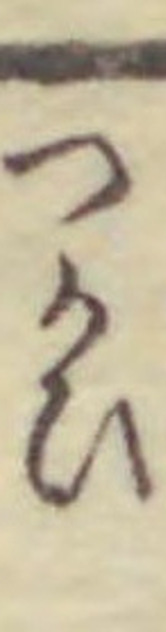つかひ
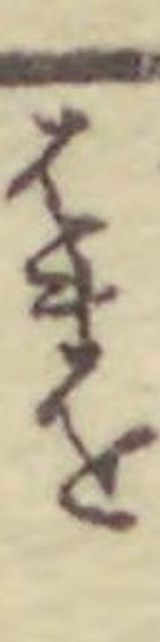はまを
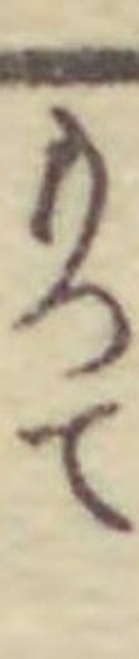もつて
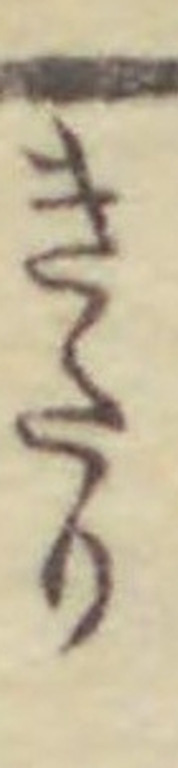きたり
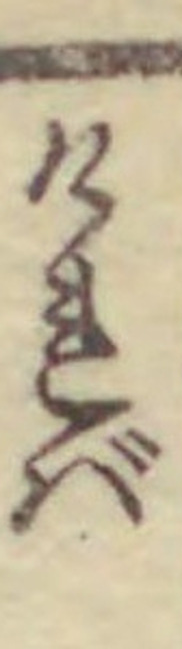ければ
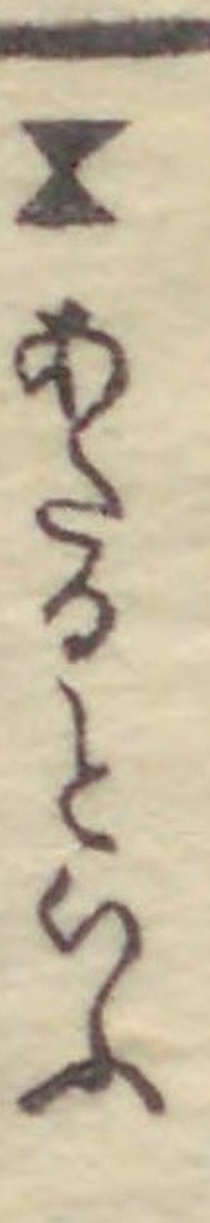▼▲あたるといふ
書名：大時代唐土化物 3巻. 曽我太夫染
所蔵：国立国会図書館 National Diet Library, JAPAN
